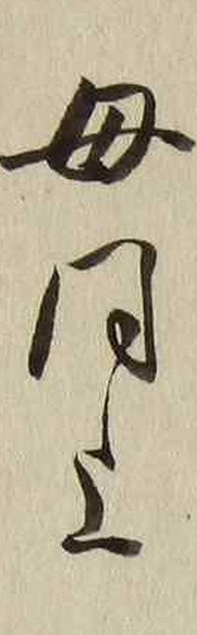母同上

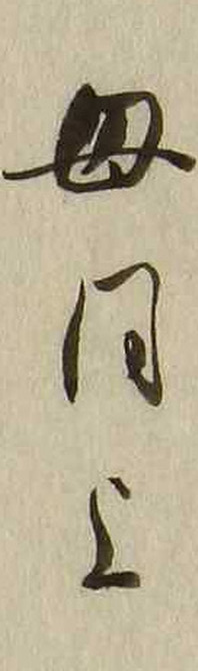母同上
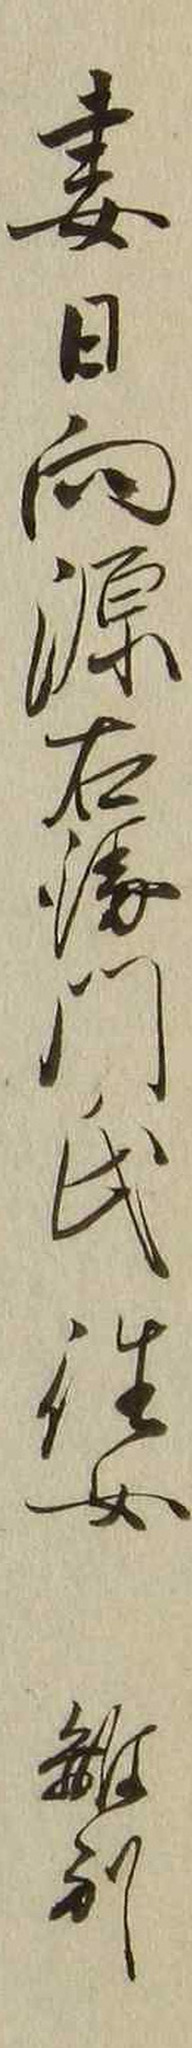妻日向源右衛門氏往女離別
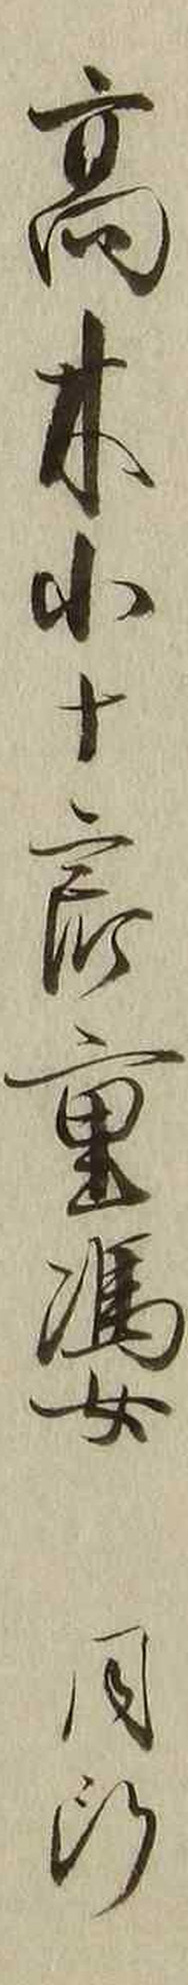高木小十節重島馮女同断
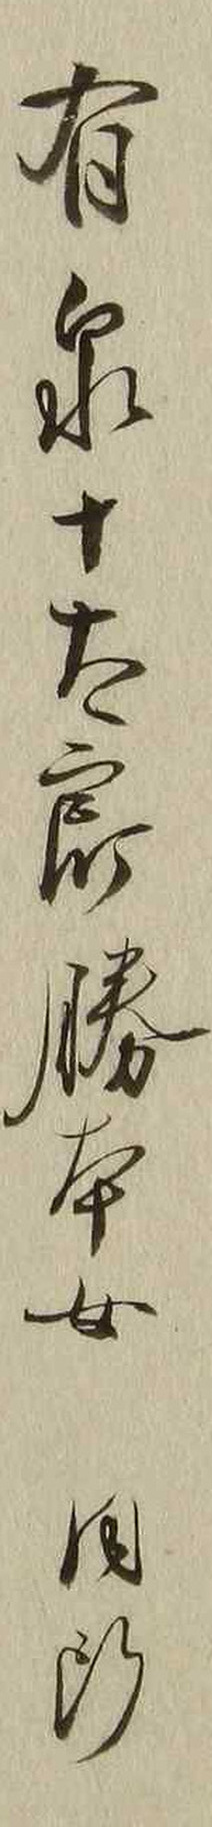有泉十太郎勝本女同断
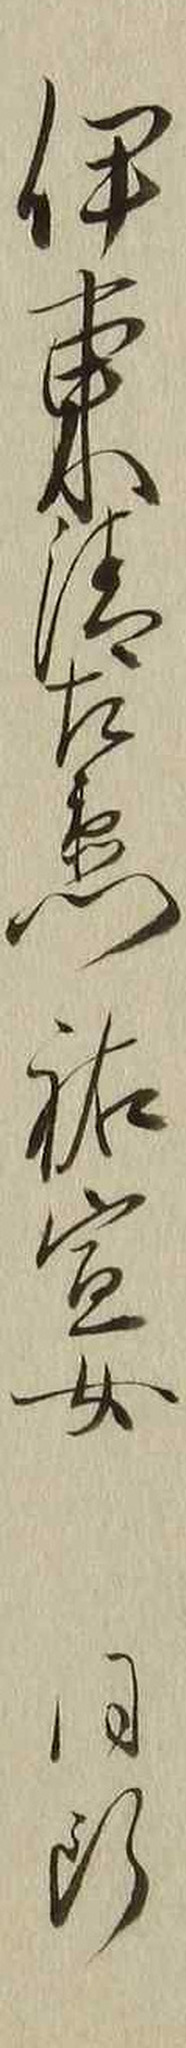伊東清左衛門祐宣女同断
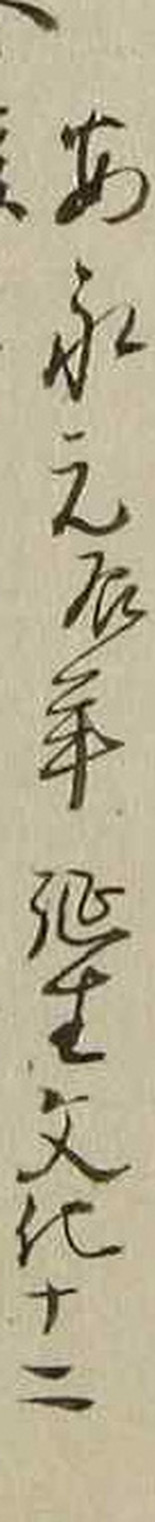安永元辰年誕生文化十二
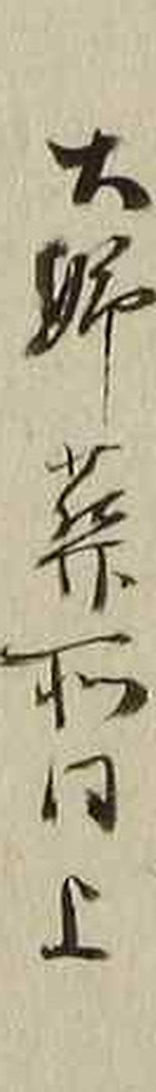大姉葬所同上
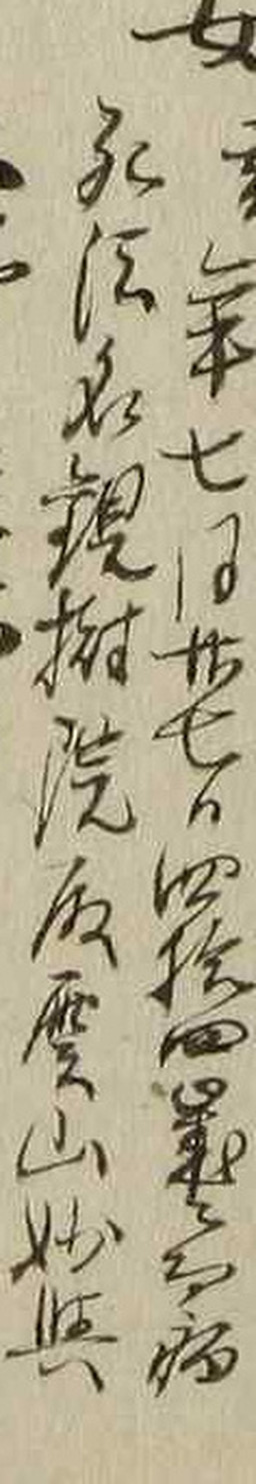死法名観樹院殿雲山妙輿
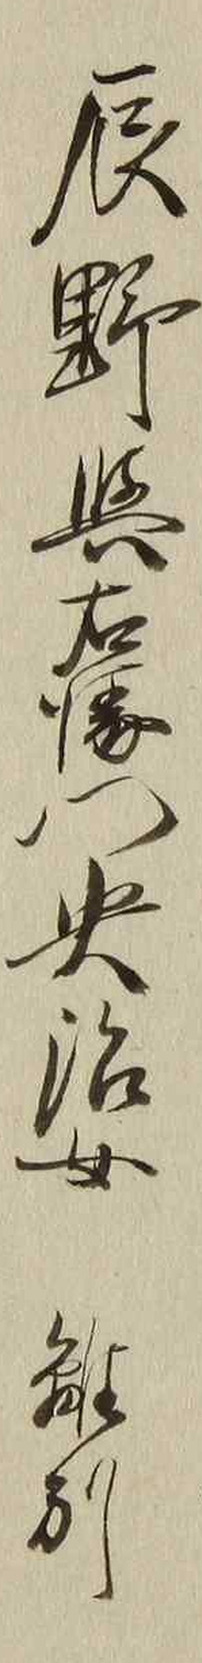辰野与右衛門央治女雛別
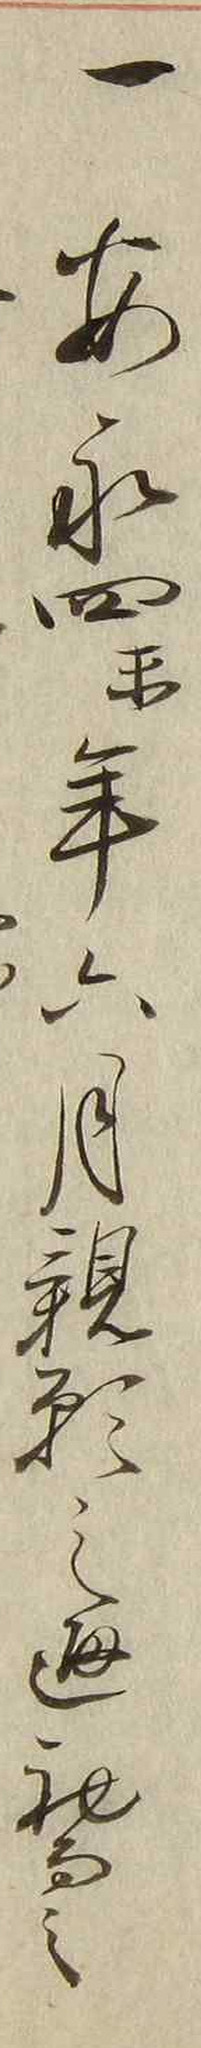一安永四未年六月親願之通初而之
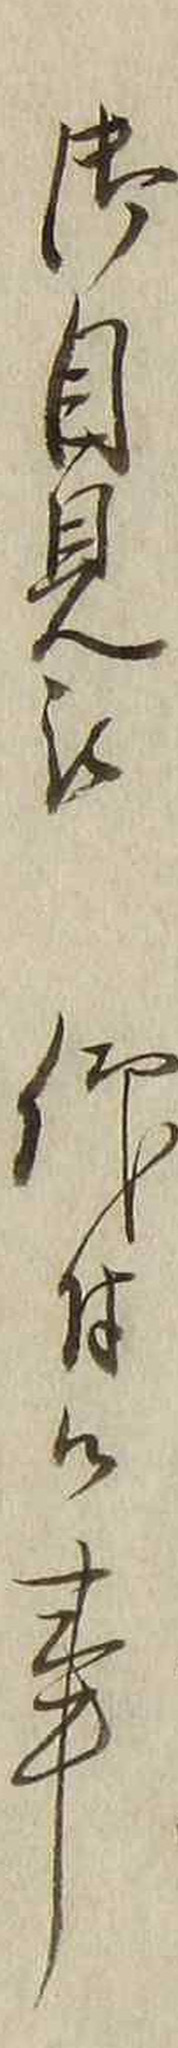御目見被仰付候事
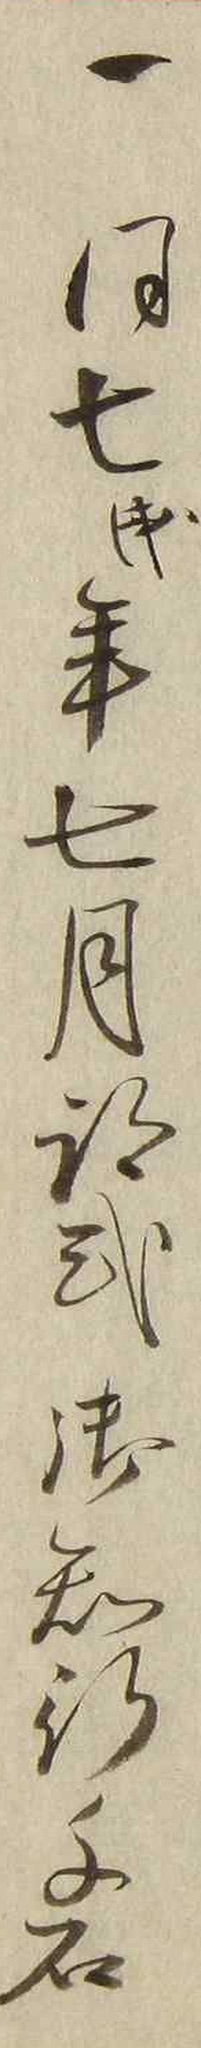一同七戌年七月跡式御知行千石

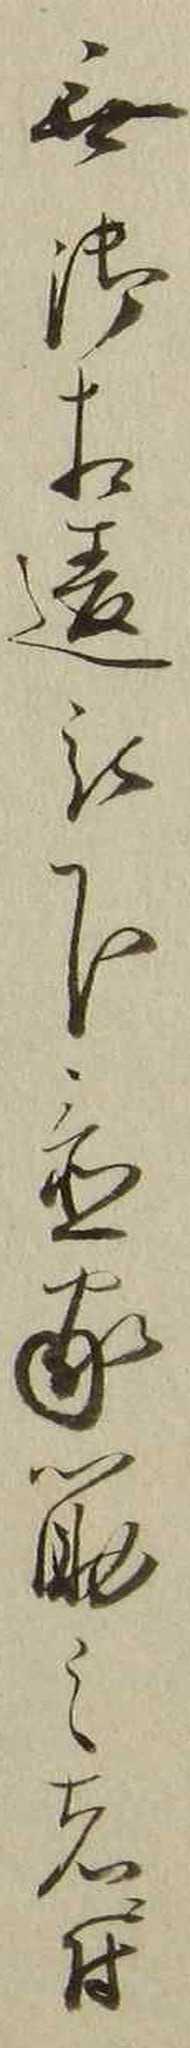無御相違分被下置家筋之者に付
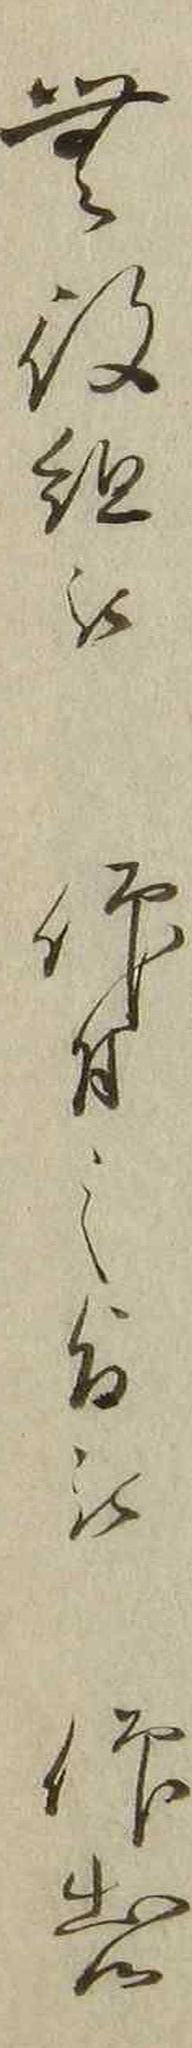無役組被仰付之旨被仰出候
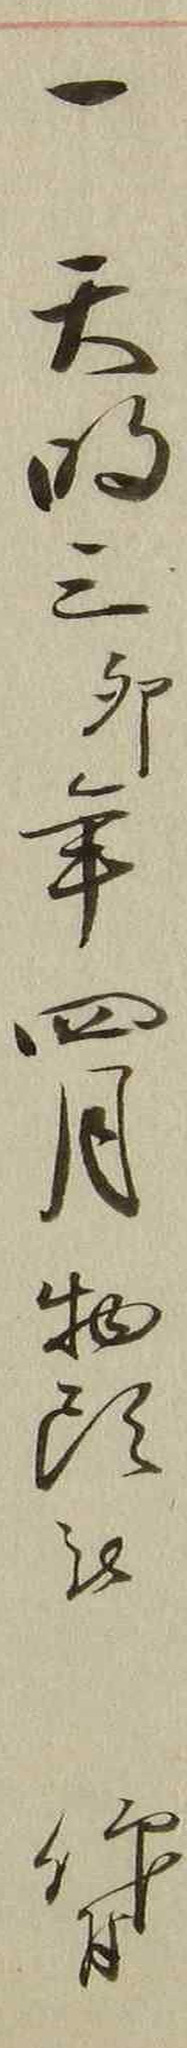一天明三卯年四月物頭被仰付
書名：諸士系譜　巻之103　か之部11
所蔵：会津若松市立会津図書館
